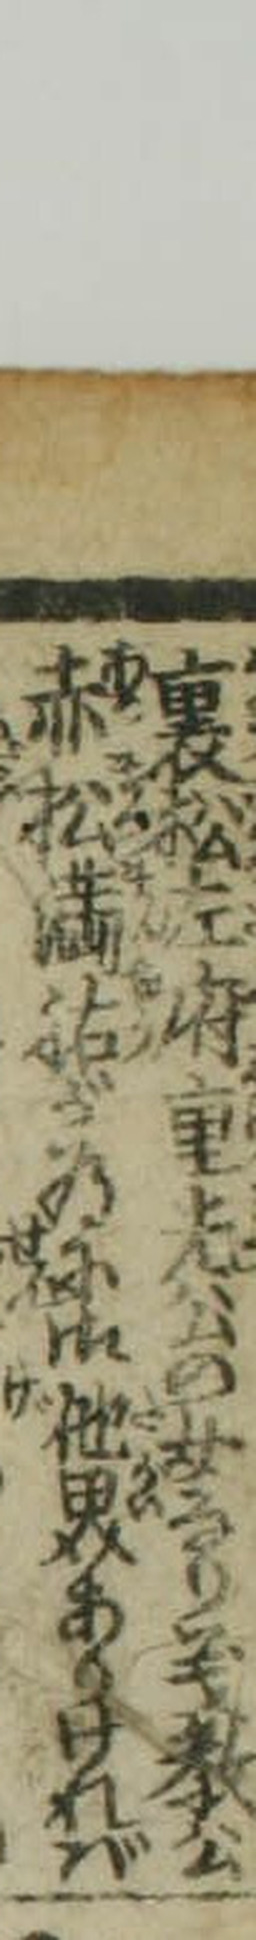赤松満祐が為に御他界ありければ
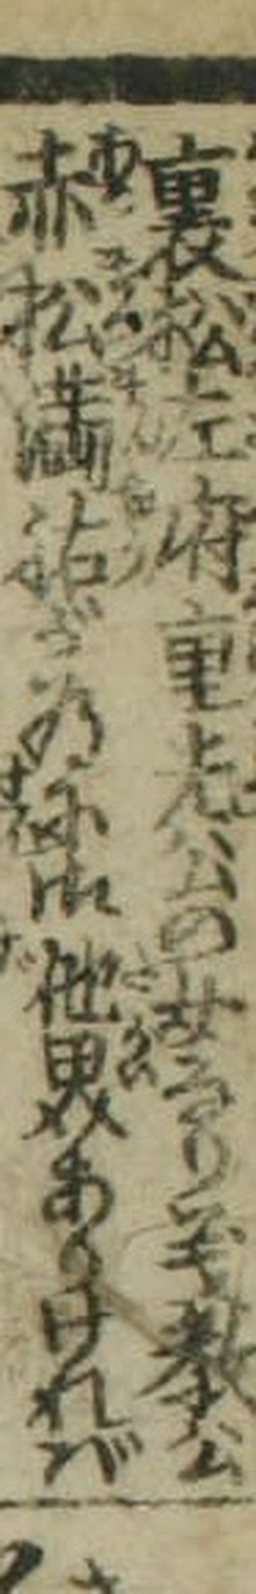赤松満祐が為に御他界ありければ
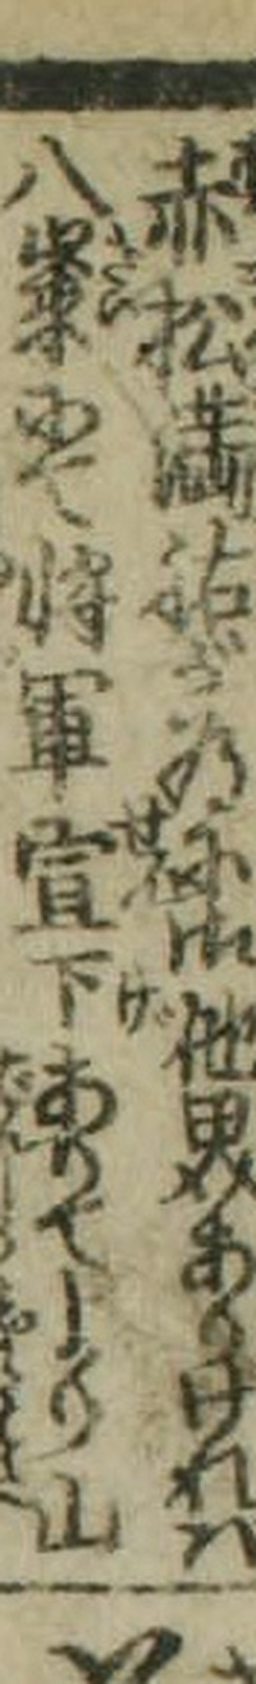八歳にて将軍宣下ありてより山
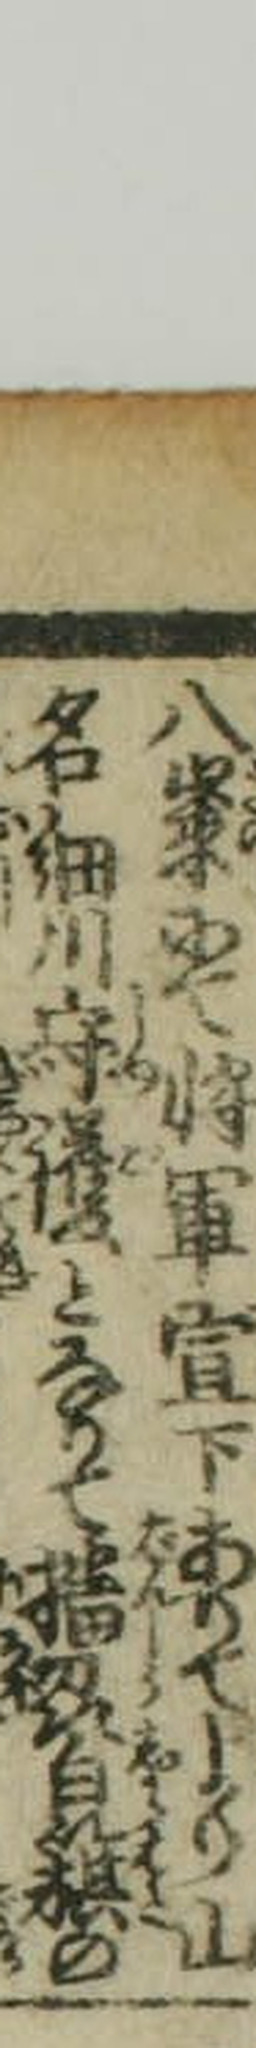名細川守護となりて播州白旗の
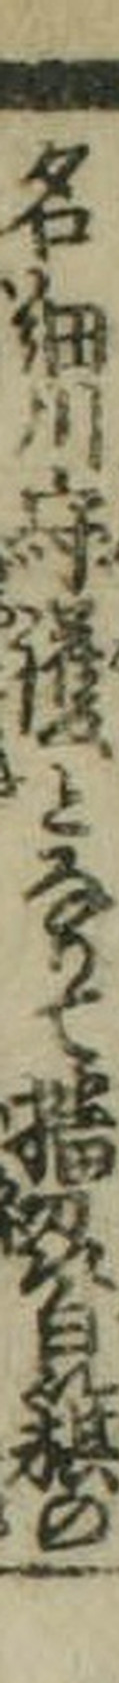名細川守護となりて播州白旗の
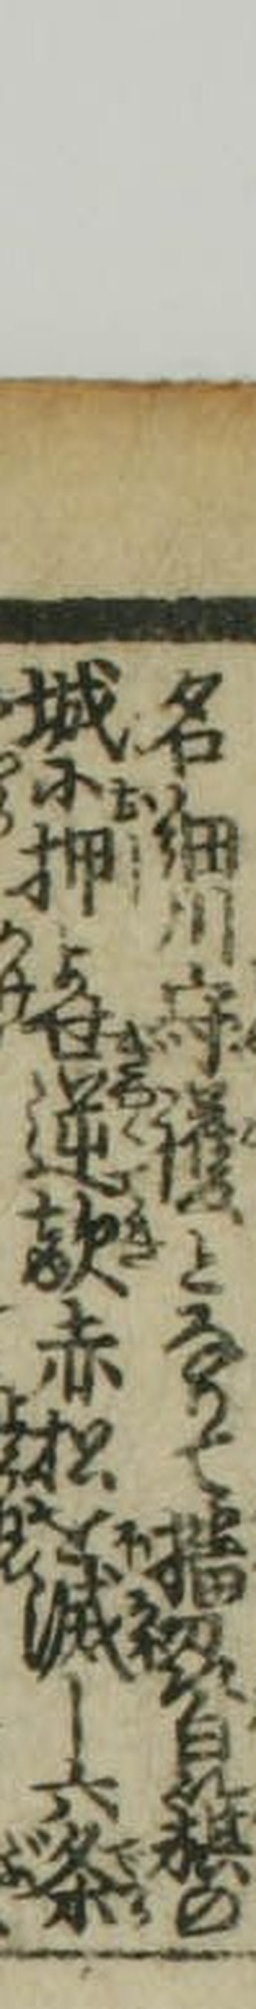城に押よせ逆敵赤松を滅し六条
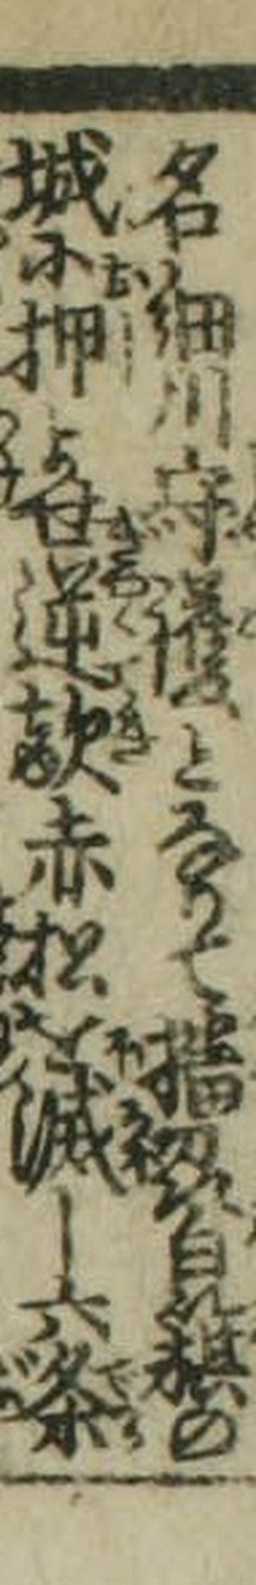城に押よせ逆敵赤松を滅し六条
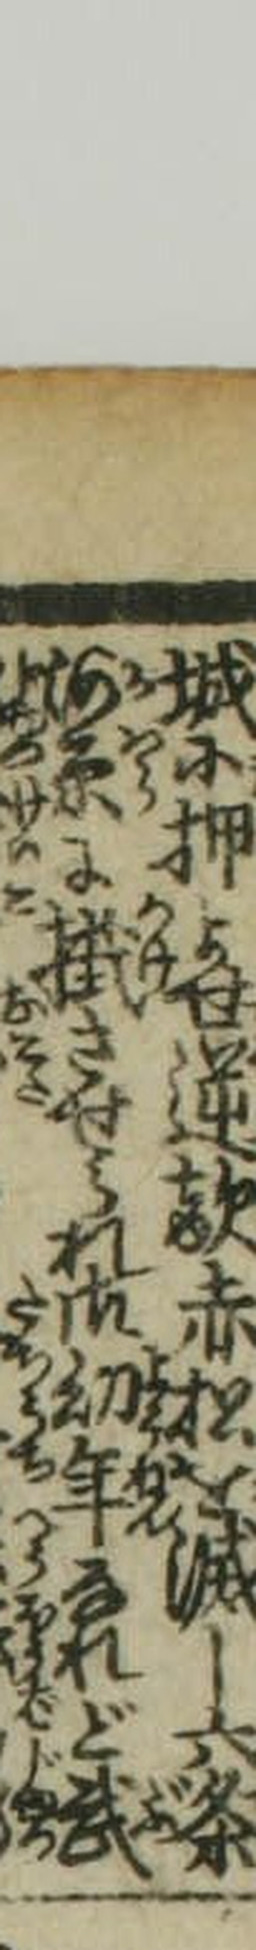河原に掛させられ御幼年なれど武
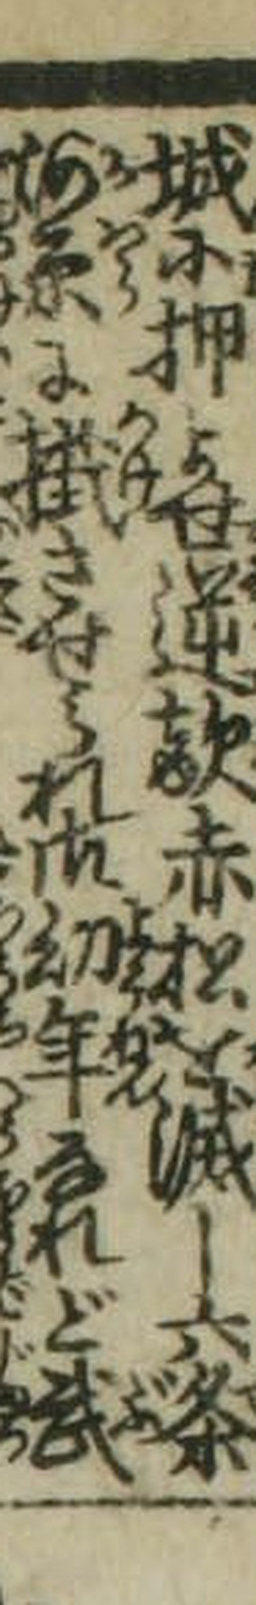河原に掛させられ御幼年なれど武
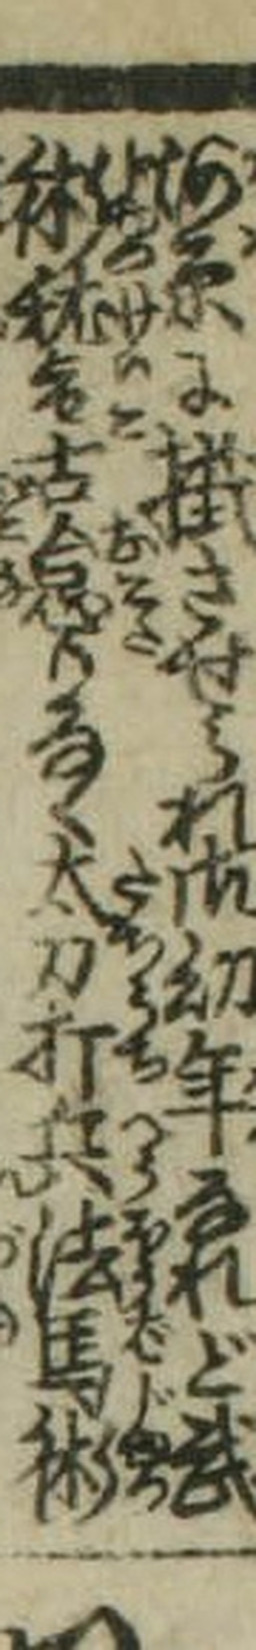術稽古怠りなく太刀打兵法馬術
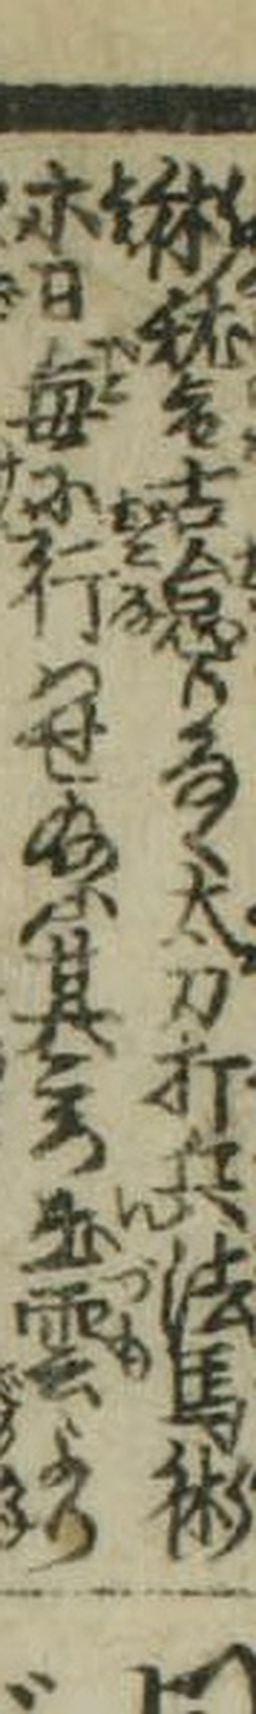等日毎に行はせ給ふ其ころ出雲より
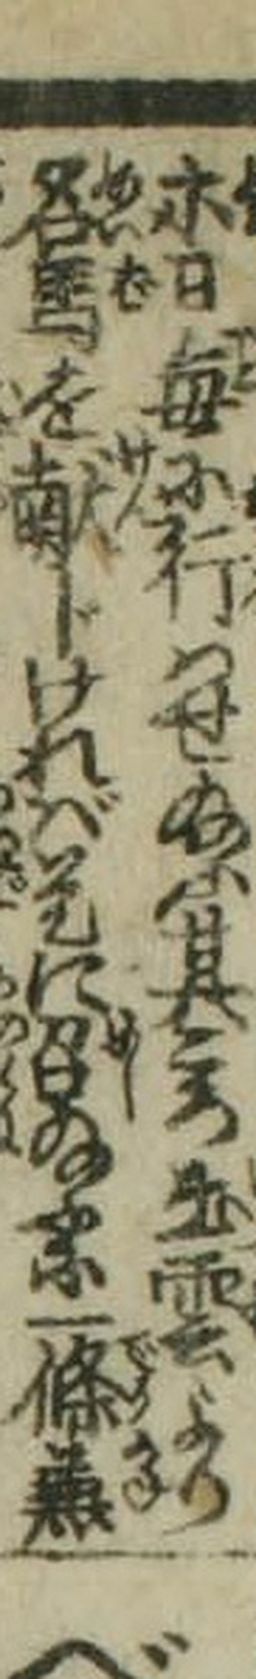名馬を献じければ是に召給ふに一乗兼
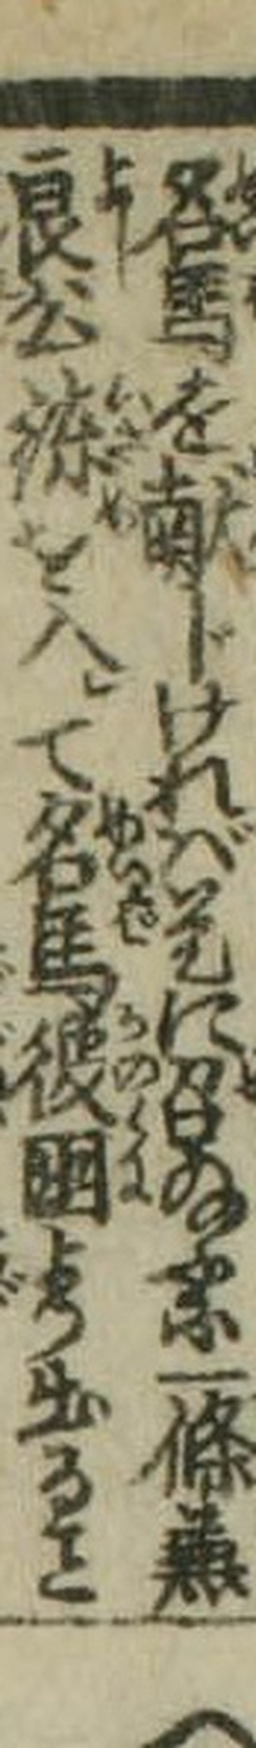良公諫を入れて名馬彼国より出ること
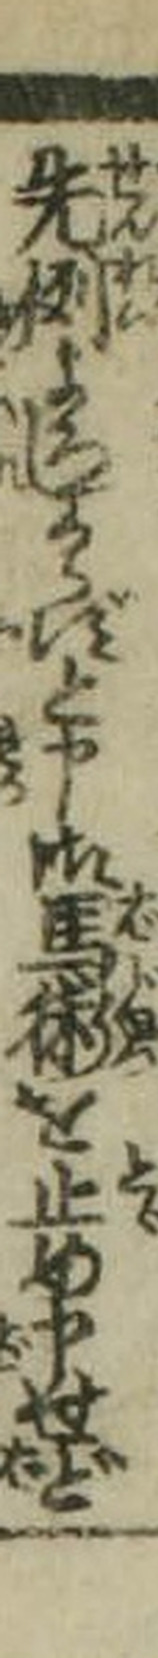先例よろしからずと申し御馬術を止め申せど
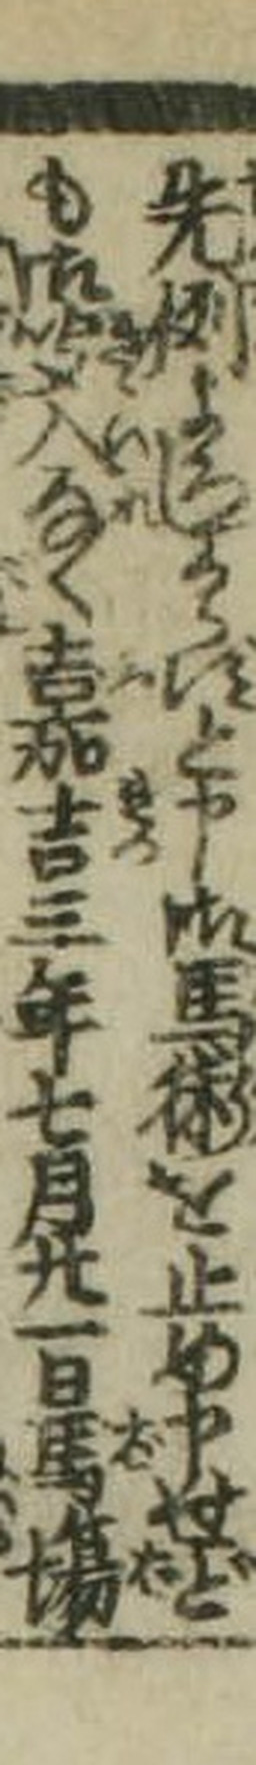も御聞入なく嘉吉三年七月廿一日馬場
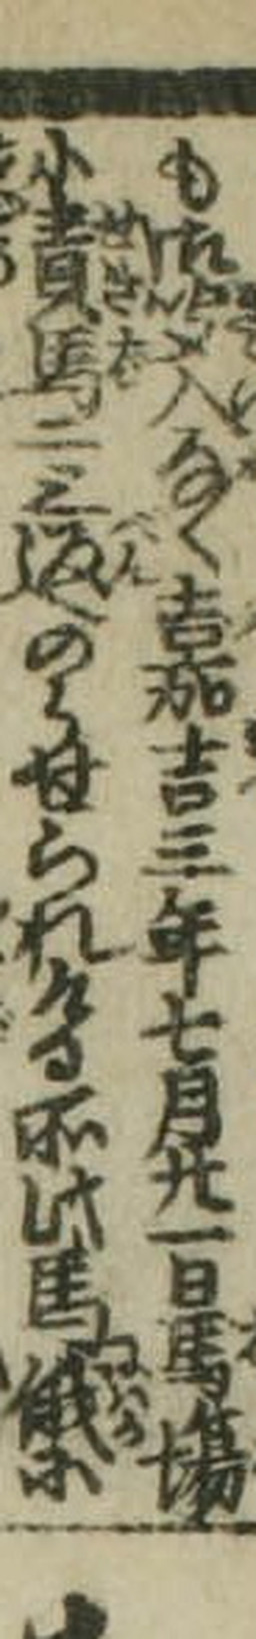に責馬二三返のらせられける所此馬俄に
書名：續英雄百人一首
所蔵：東京学芸大学附属図書館
